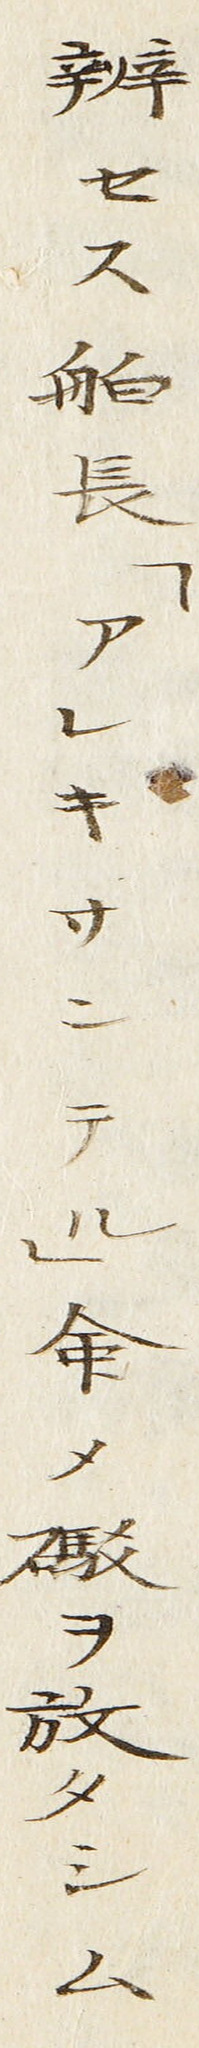弁セス舶長「アレキサンテル」命シテ礟ヲ放タシム
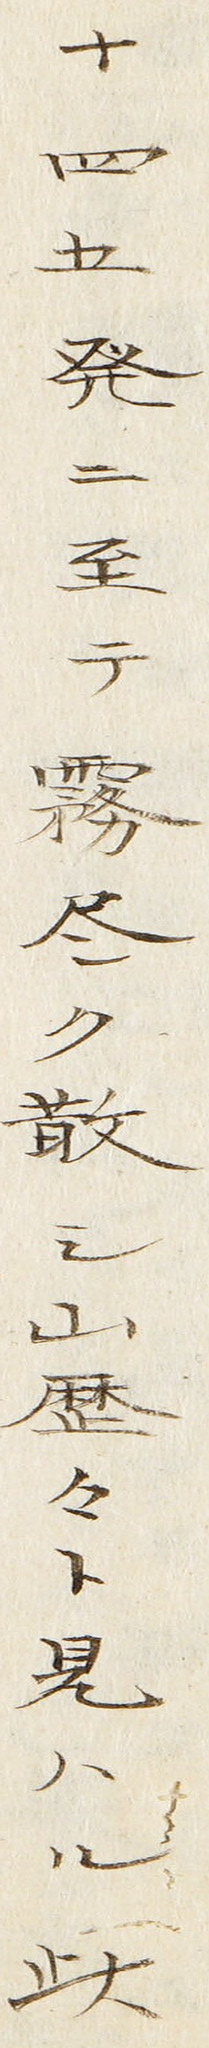十四五発ニ至テ霧尽ク散シ山歴々ト見ハル此
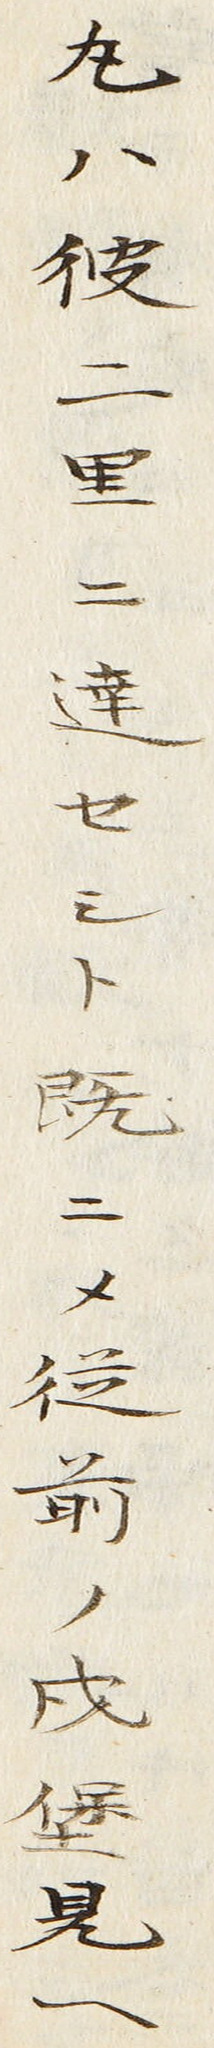丸ハ彼二里ニ達セシト既ニシテ従前ノ戍堡見ヘ
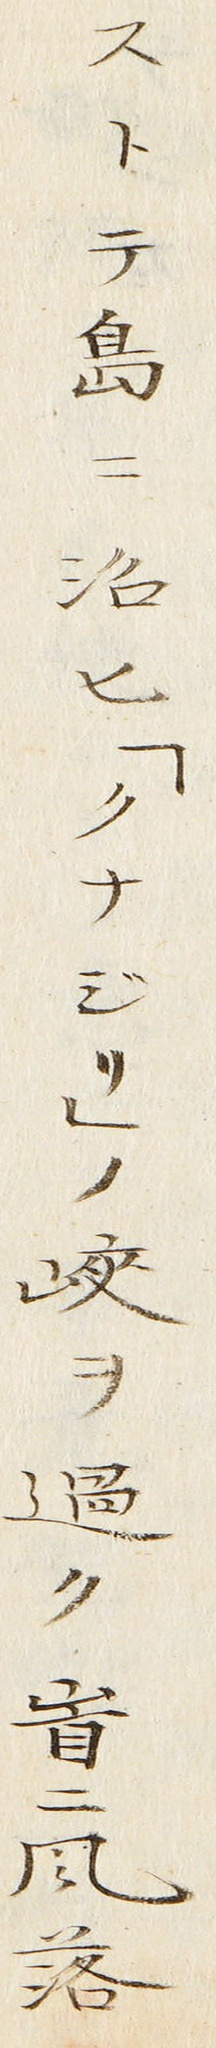ストテ島ニ沿ヒ「クナジリ」ノ峽ヲ過ク旹ニ風落
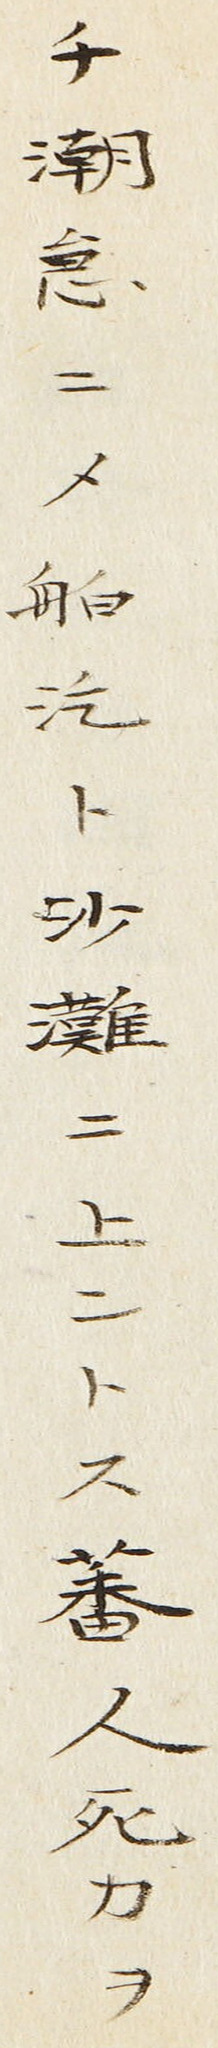チ潮急ニシテ舶汔ト沙灘ニ上ントス蕃人死力ヲ
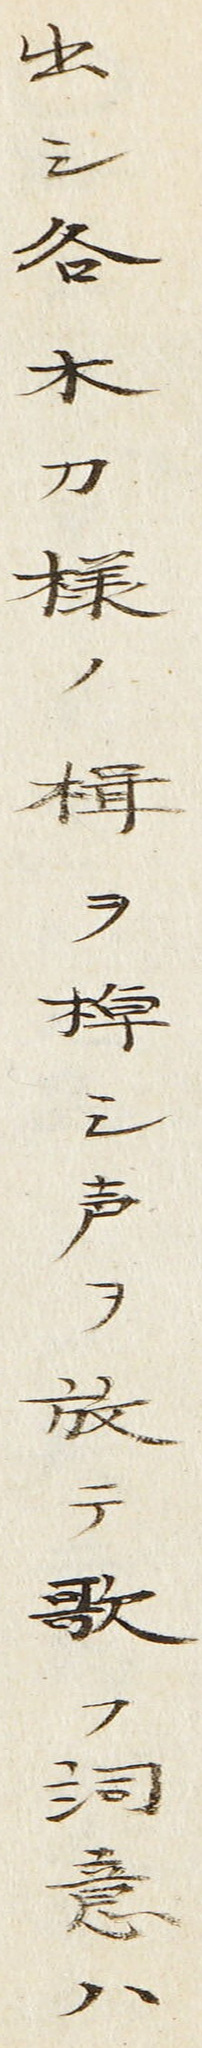出シ各木刀様ノ楫ヲ棹シ声ヲ放テ歌フ詞意ハ
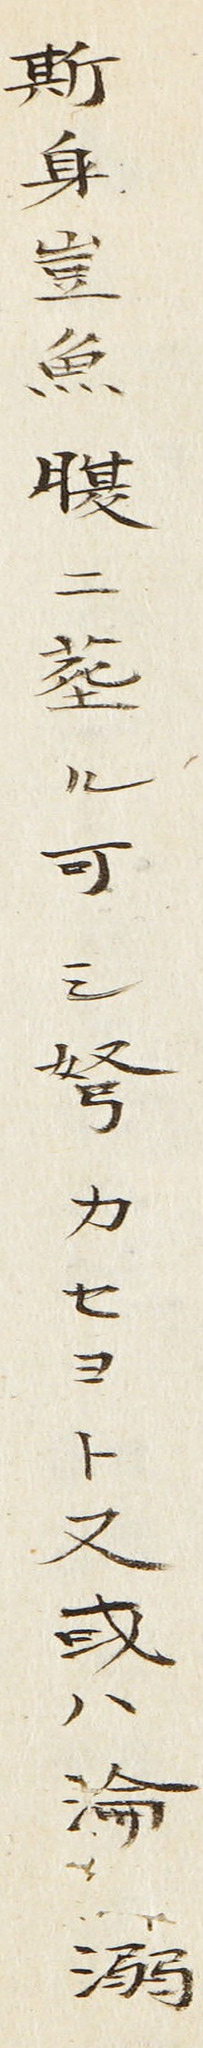斯身豈魚腹ニ塟ル可シ弩力セヨト又或ハ淪溺
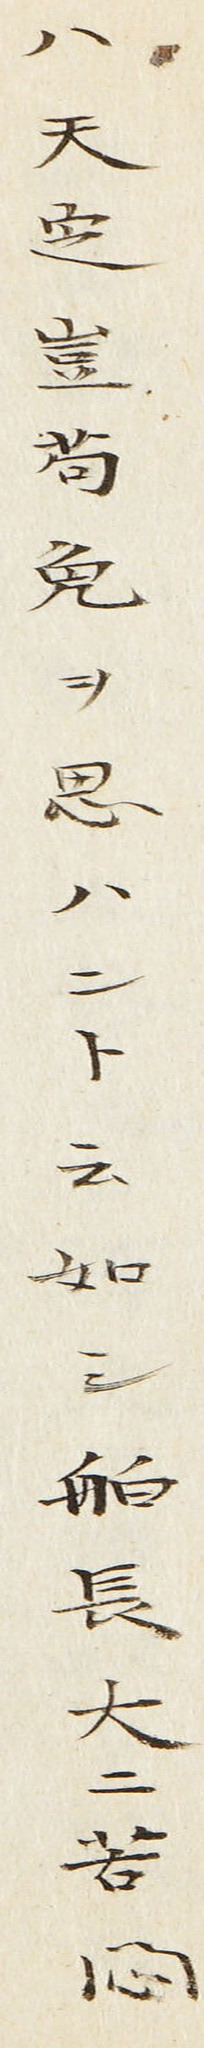ハ天定豈苟免ヲ思ハント云如シ舶長大ニ苦悶
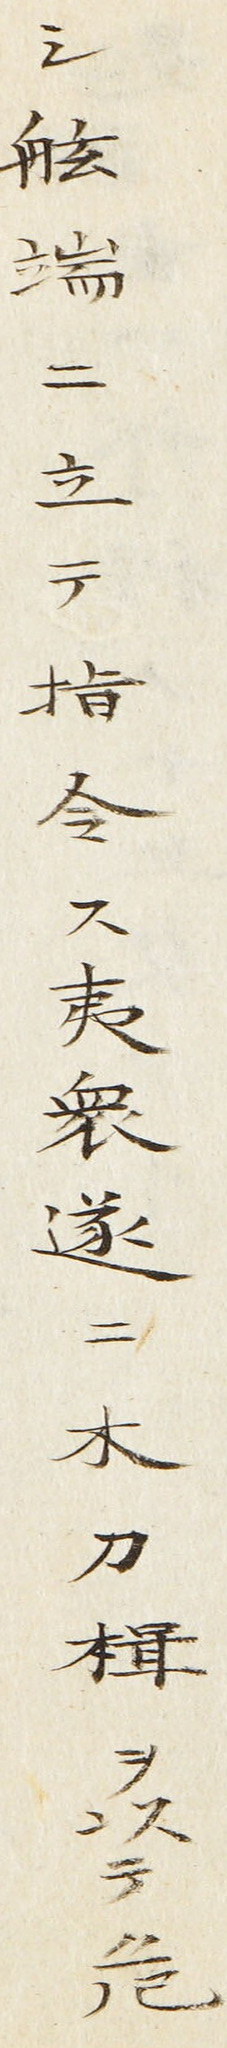シ舷端ニ立テ指令ス夷衆遂ニ木刀楫ヲ以テ危
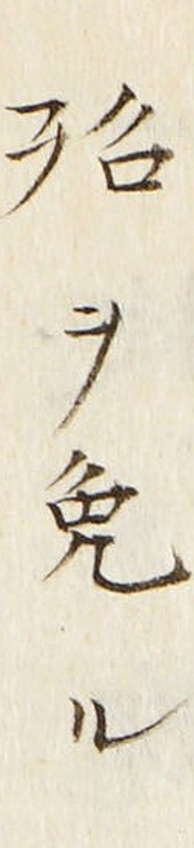殆ヲ免ル
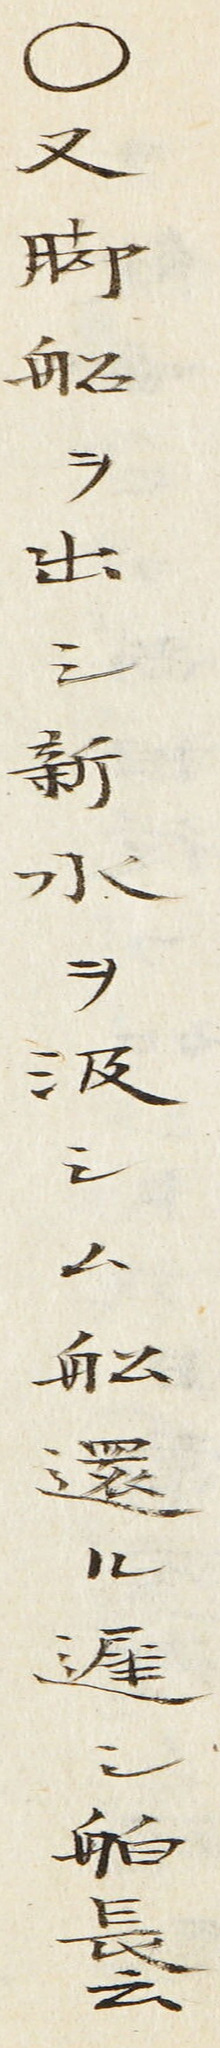○又脚船ヲ出シ新水ヲ汲シム船還ル遅シ舶長云
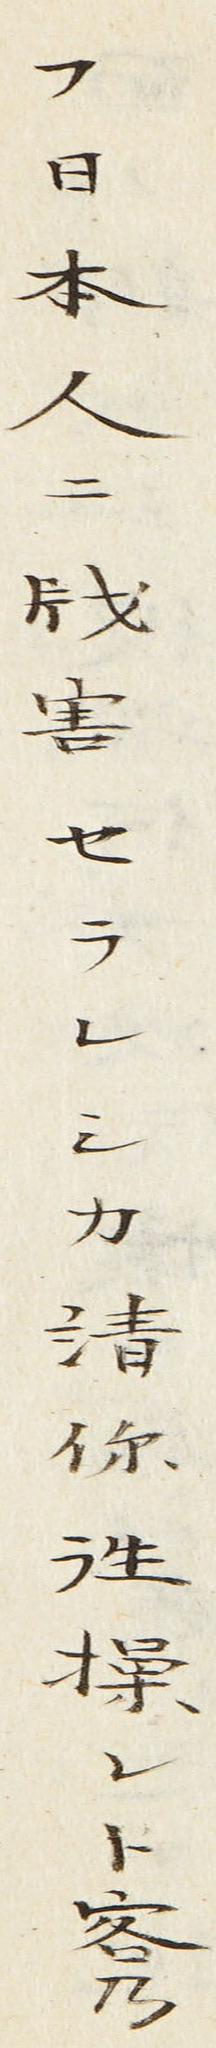フ日本人ニ𢦤害セラレシカ請你往操レト客乃
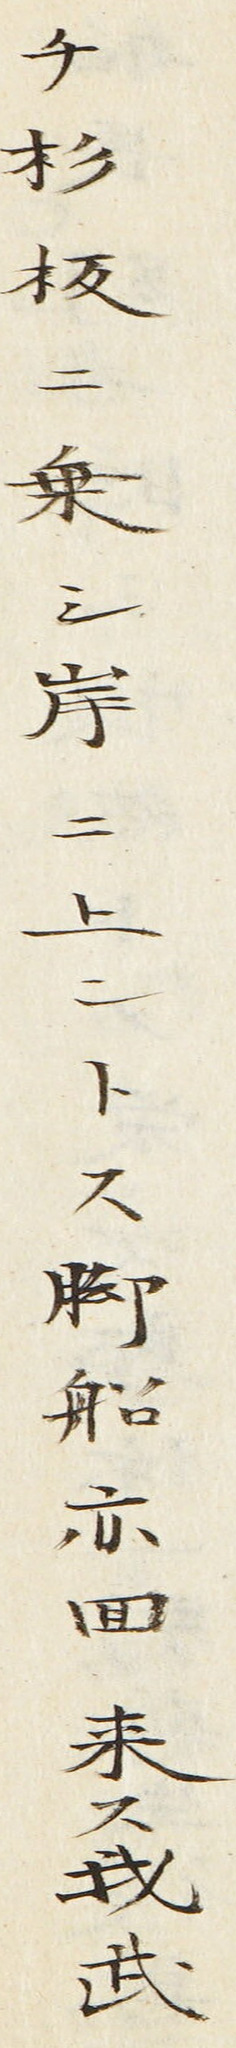チ杉板ニ乗シ岸ニ上ントス脚船亦回来ス我武
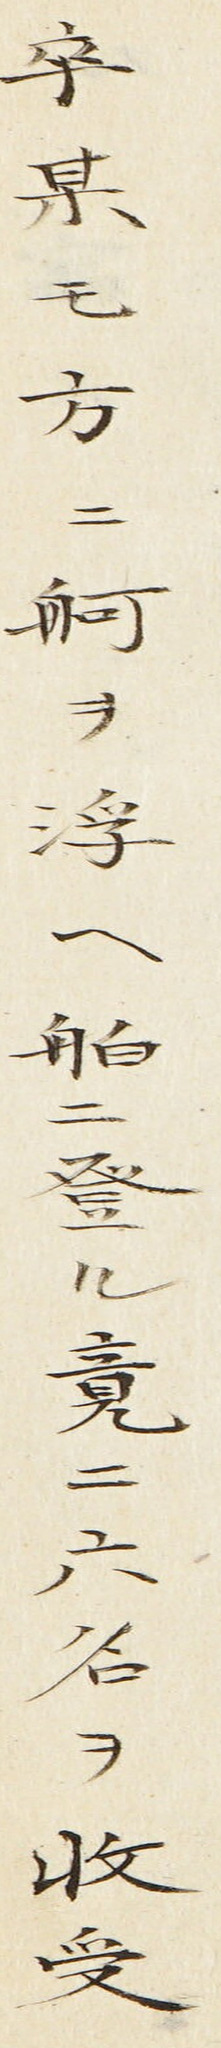卒某モ方ニ舸ヲ浮ヘ舶ニ登ル竟ニ六名ヲ収受

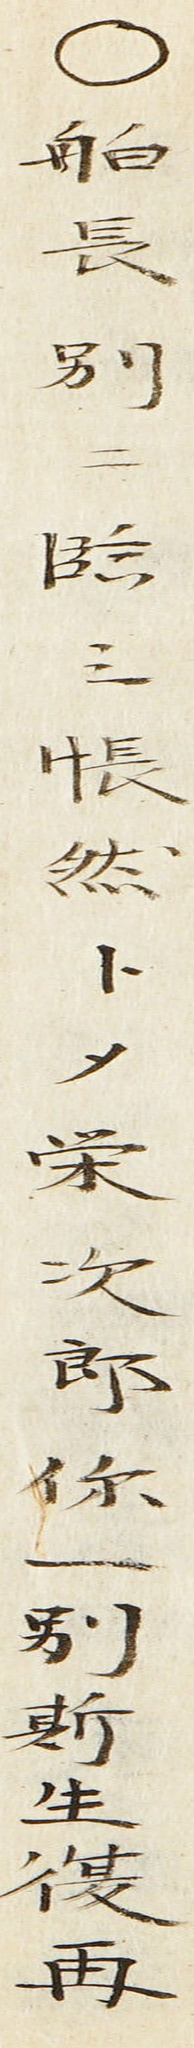○舶長別ニ臨ミ悵然トシテ栄次郎你一別斯生復再
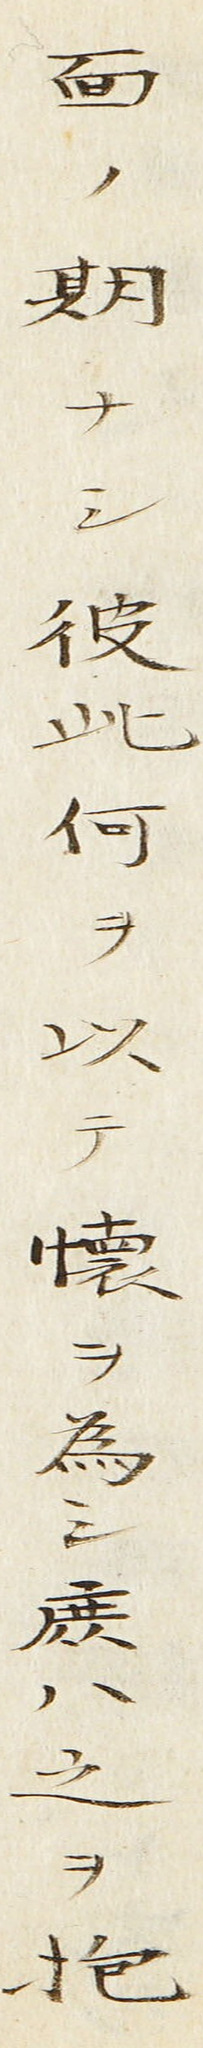面ノ期ナシ彼此何ヲ以テ懐ヲ為シ庶ハ之ヲ抱
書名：流蕃通書
